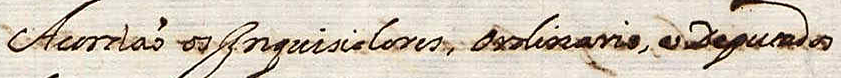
Acordaõ os Jnquisidores, Ordinario, os Deputados
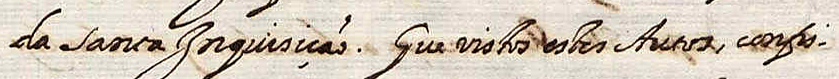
da santa Jnquisiçaõ. Que vistos estes Autos, confis
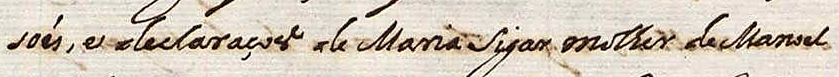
soẽs, e declaraçoẽs de Maria Sigar molher de Manoel
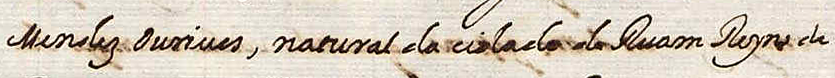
Mendez Ouriues, natural da cidade de Ruam Reyno de
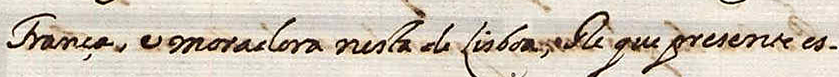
França, e moradora nesta de Lisboa, e Re que presente es
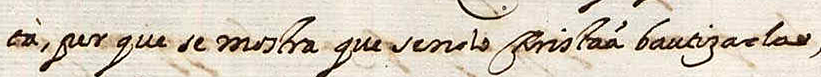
tà, perque se mostra que sendo Christaã bautizada,
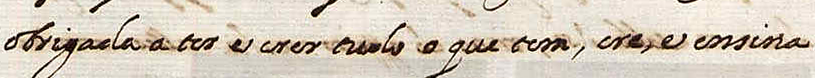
obrigada a ter e crer tudo o que tem, cre, e ensina
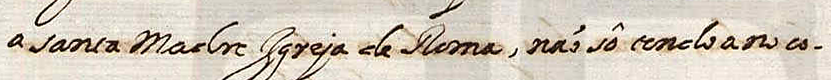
a santa Madre Jgreja de Roma, naõ sô tendo a no co
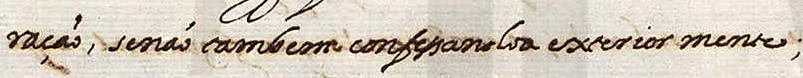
raçaõ, senaõ tambem confessando a exteriormente;
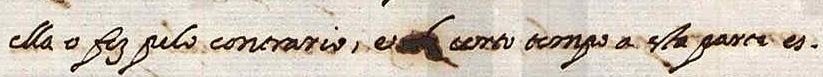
ella o fez pelo contrario, e de certo tempo a esta parte es
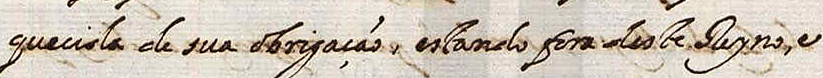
quecida de sua obrigaçaõ, estando fora deste Reyno, e
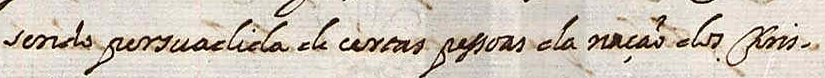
sendo persuadida de certas pessoas da naçaõ dos Chris
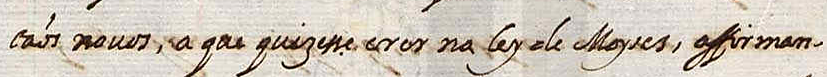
taõs novos, a que quizesse crer na ley de Moyses, affirman
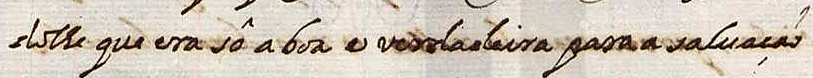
do lhe que era sô a boa e verdadeira para a saluaçaõ
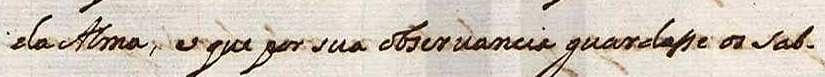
da Alma, e que por sua observancia guardasse os sab
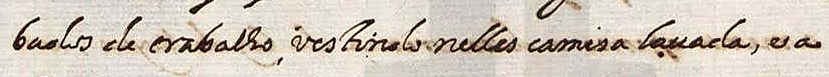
bados de trabalho, vestindo nelles camisa lauada, e a
